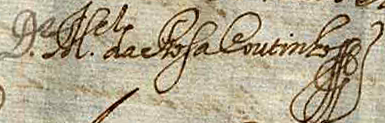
Dr M.el da Rosa Coutinho
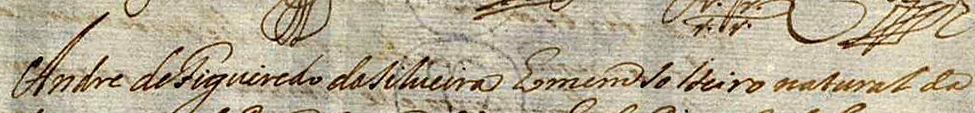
Andre de Figuiredo da silueira homem solteiro natural da
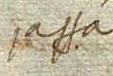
1a tt.a
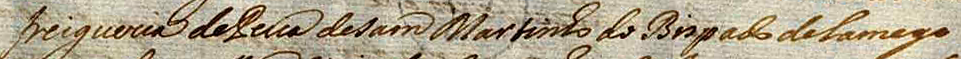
freiguezia de Peua de sam Martinho do Bispado de Lamego
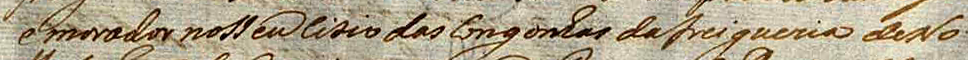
e morador no sseu citio das congonhas da freiguezia de No
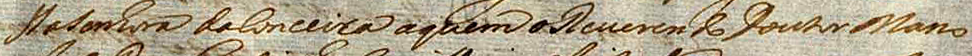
ssa senhora da Conceira a quem o Reuerendo Doutor Mano
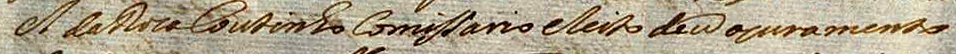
el da Roza Coutinho Comissario eleito deu o juramento
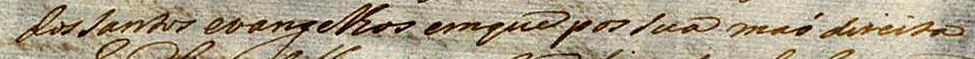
dos santos evangelhos em que pos sua maõ direita
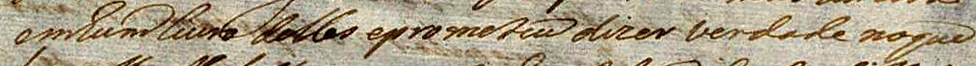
em hum liuro delles e prometeu dizer verdade no que
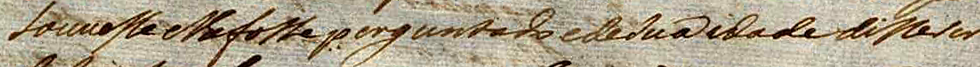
souuesse e lhe fosse perguntado e de sua idade disse ser
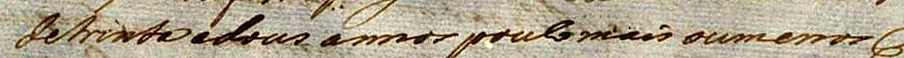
de trinta e dous annos pouco mais ou menos
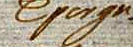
E pergu
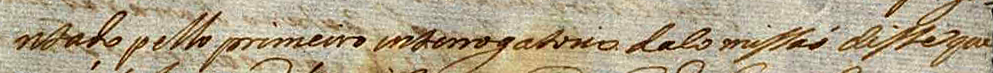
ntado pello primeiro interrogatorio da Comissaõ disse que
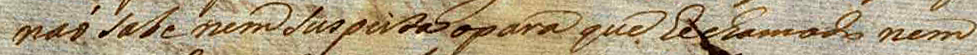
naõ sabe nem suspeita o para que he chamado nem
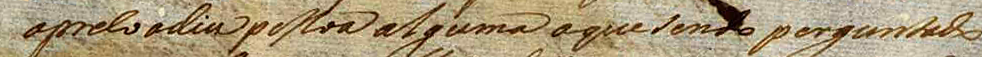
o preçoadiu pessoa alguma a que sendo perguntado
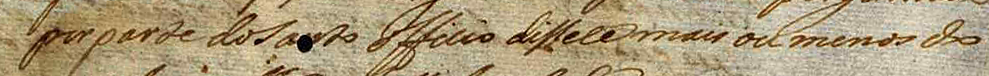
por parte do santo officio dissece mais ou menos de
